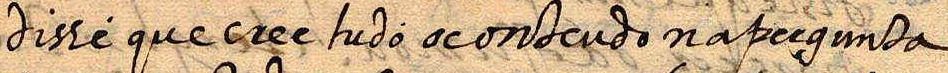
disse que cree tudo o conteudo na pergunta
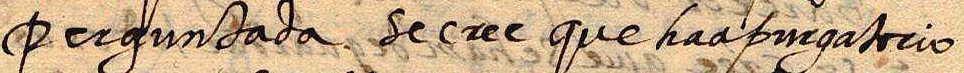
perguntada. se cree que haa purgatorio
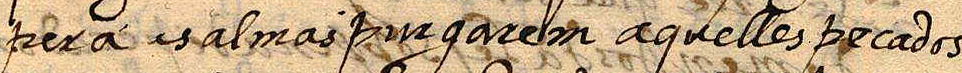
pera as almas purgarem aquelles pecados
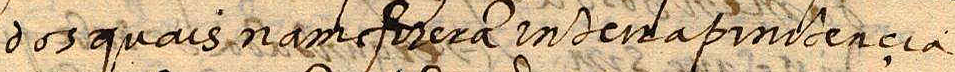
dos quais nam fizerā inteira pinitençia
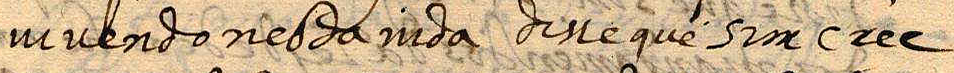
uiuendo nesta uida disse que sim cree
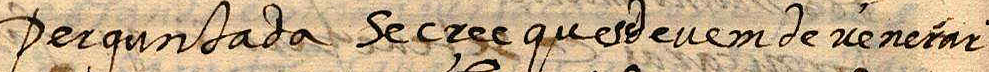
Perguntada se cree que se deuem de uenerar
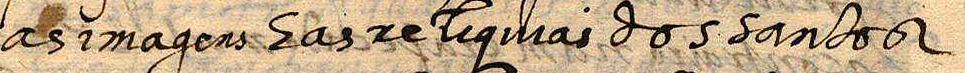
as imagens E as reliquias dos santos
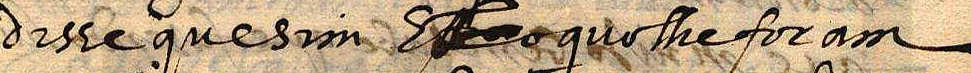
disse que sim E loguo lhe foram
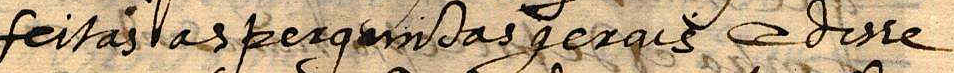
feitas as pergunctas gerais e disse
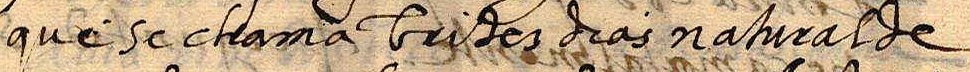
que se chama brites dias natural de
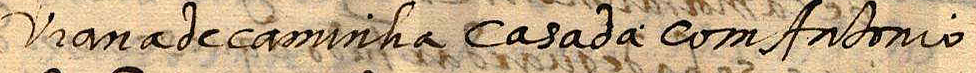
Viana de caminha casada com Antonio
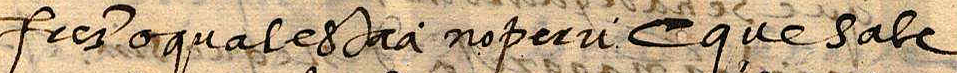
frez̄ o qual estaá no peru e que sabe
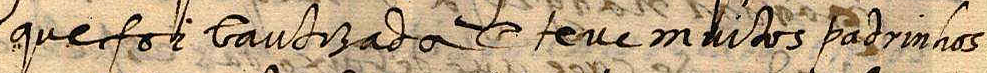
que foi bautizada e teue muitos padrinhos
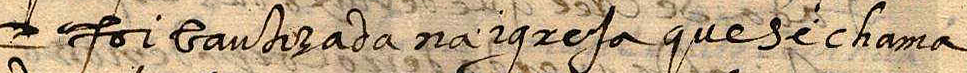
e foi bautizada na igreJa que se chama
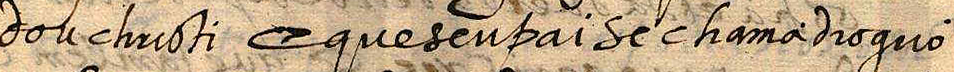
dou christi e que seu pai se chama dioguo
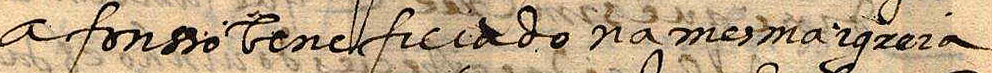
afonsso beneficiado na mesma igreia
